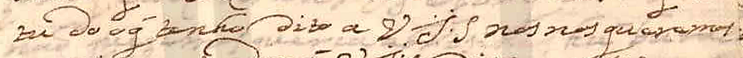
tudo o q̄ tenho dito a V. J .S. nos nos queremos
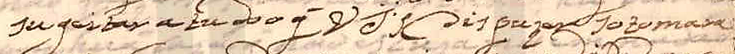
sugeitar a tudo q̄ V. J. S dispuzer so tomara
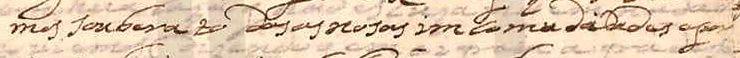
mos soubera todas as nosas imcomudidades e por
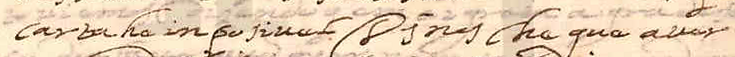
carta he inposiuel Ds̄ nos Chegue auer
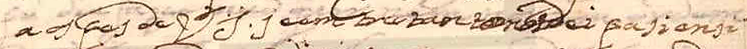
aos pes de V J. S e emtretanto nos dei pasiensi
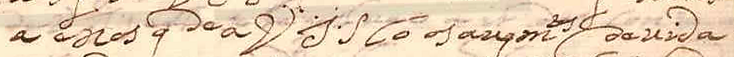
a e nos gde a V J. S Cō os augmtos de uida
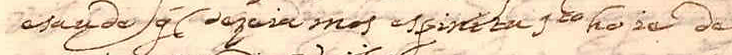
e saude q̄ dezeiamos espiritu sto hoie de
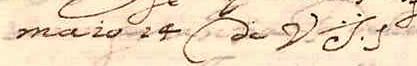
maio 24 de V J. S
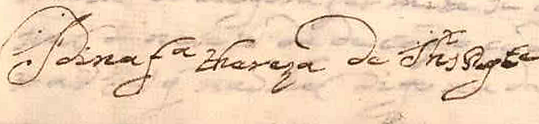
J̄dina f.a thereza de Ih̄s Regte
